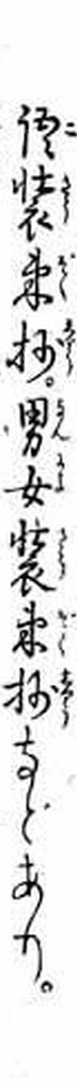語装束抄。男女装束抄などあり。
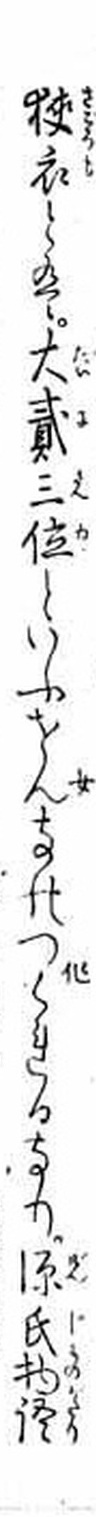狭衣とは。大弐三位といふをんなのつくれるなり。源氏物語
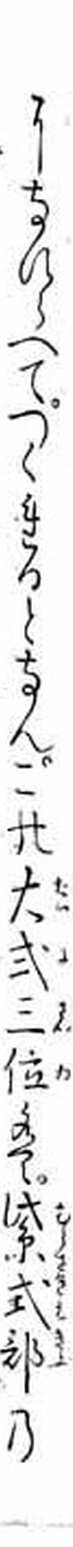になすらへて。つくれるとなん。この大弐三位は。紫式部の
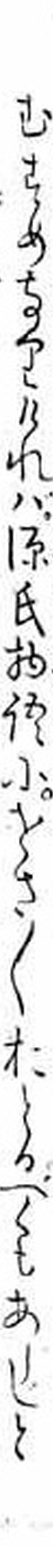むすめなりければ。源氏物語に。をさ〳〵おとるべくもあらじと
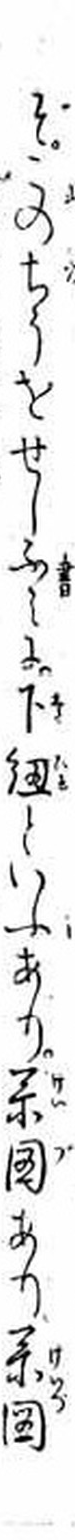ぞ。このちうをせしふみに。下紐といふあり。系図あり。系図
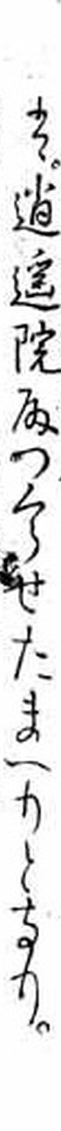は。逍遥院殿つくらせたまへりとなり。
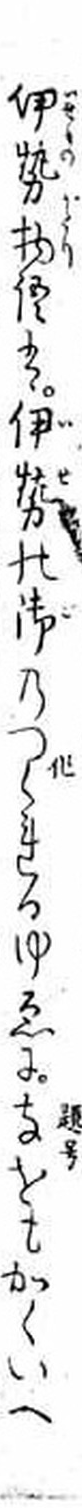伊勢物語は。伊勢の御のつくれるゆゑに。なをもかくいへ
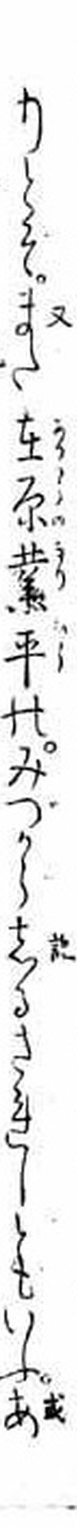りとぞ。また在原業平の。みづからしるされしともいふ。あ
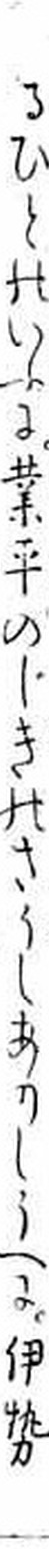るひとのいふに。業平のじきのさうしありしうへに。伊勢
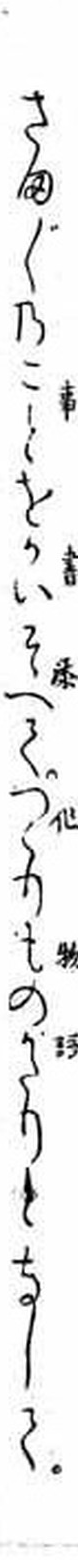さま〴〵のことをかいそへて。つくりものがたりとなして。

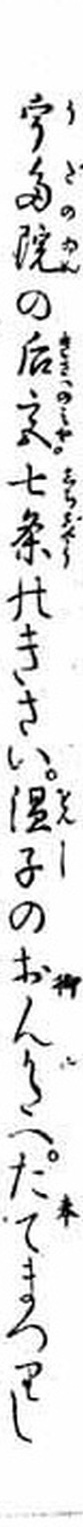宇多院の后宮。七条のきさい。温子のおんかたへ。たてまつりし
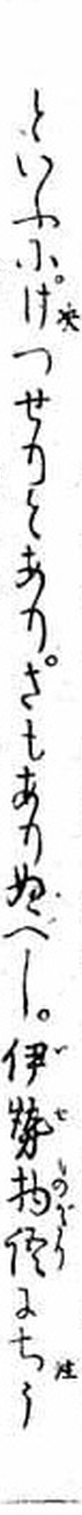といふに。けつせりとあり。さもありぬべし。伊勢物語にちう
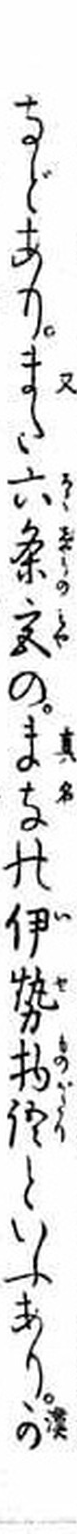などあり。また六条宮の。まなの伊勢物語といふあり。か
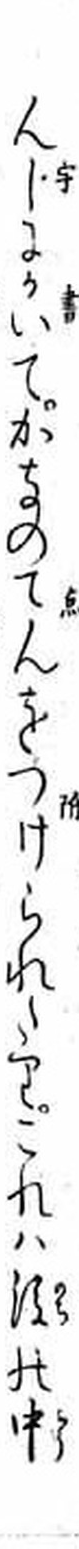んじにかいて。かなのてんをつけられたり。これは後の中
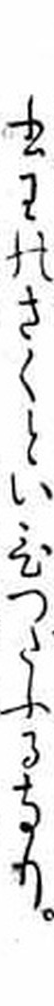書王のさくといひつたふるなり。
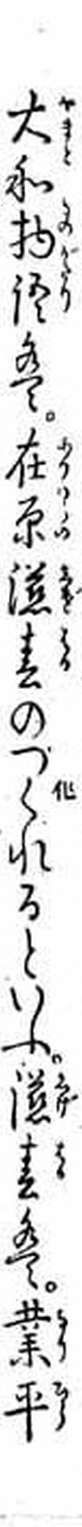大和物語は。在原滋春のつくれるといふ。滋春は。業平
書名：女学範
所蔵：東京学芸大学教育コンテンツアーカイブ
